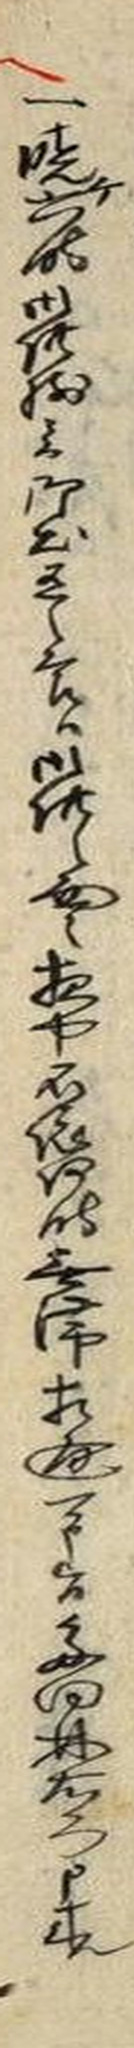一暁ヶ六時御供揃に而御出有之候節御供之面々夜中不依何時無滞相通可申旨多田林右衛門申来ル

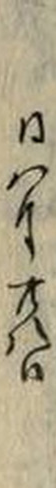同八月廿八日
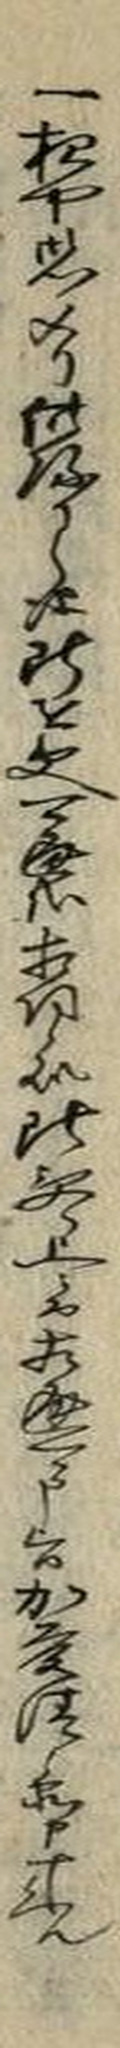一夜中御門〆り供帰り之儀断を受可通哉相伺候処断受候上に而相通可申旨加藤清兵衛申来ル
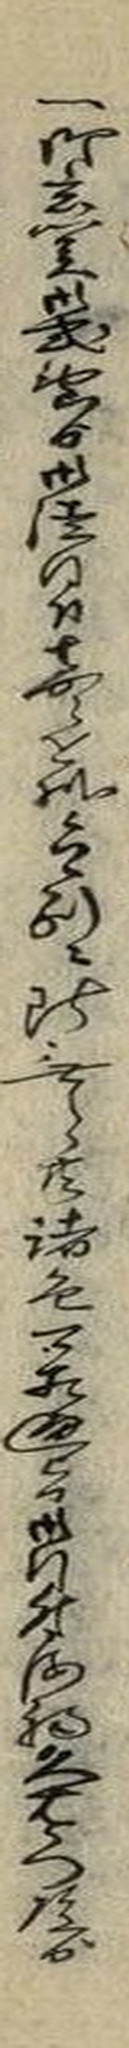一御玄関御式台ゟ御徒目付声を掛候はゝ別に断無之候共諸色可相通候旨御目付海福久右衛門殿ゟ
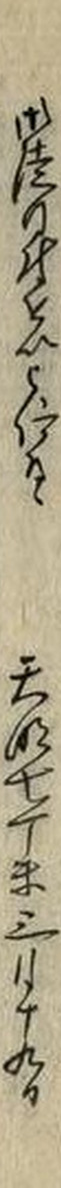御徒目付を以被仰付候天明七丁未三月十九日
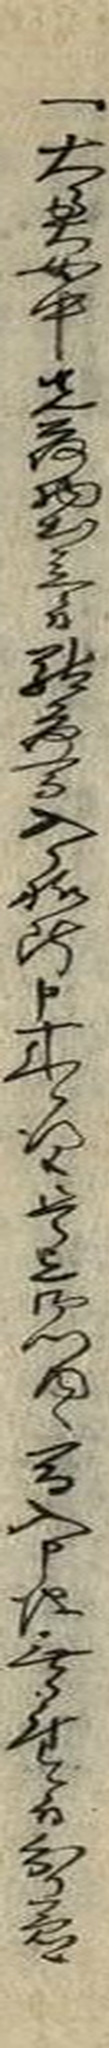一大奥女中先荷物出立に付駄荷馬入候様断申来候得共是迄御門内へ馬入申儀無御座候に付分り兼候
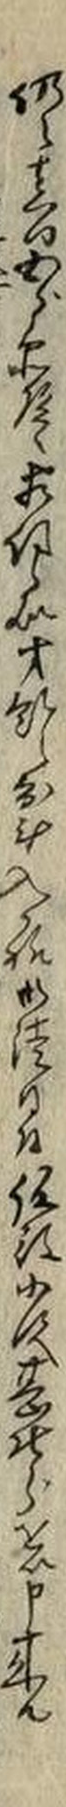仍之真田五郎兵衛殿へ相伺候処才領之分斗入候様御徒目付仮役小沢甚次郎を以申来ル
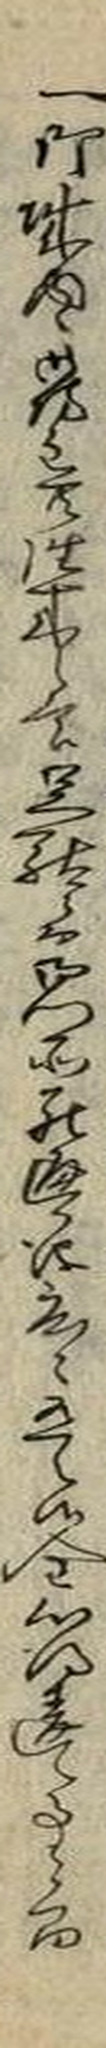一御城内御坊主共往来之節足駄に而御門所罷通候儀度々有之候全心得違之事に候間
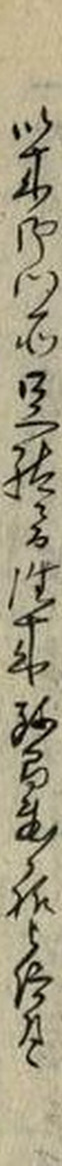以来御門所足駄に而往来致間敷候様被仰付候
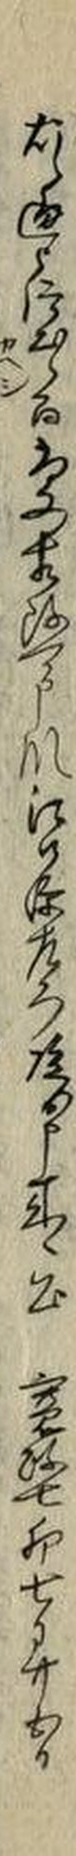右之通被仰出候間尚又相改可申候段江口源左衛門殿ゟ申来候以上寛政七卯七月廿五日
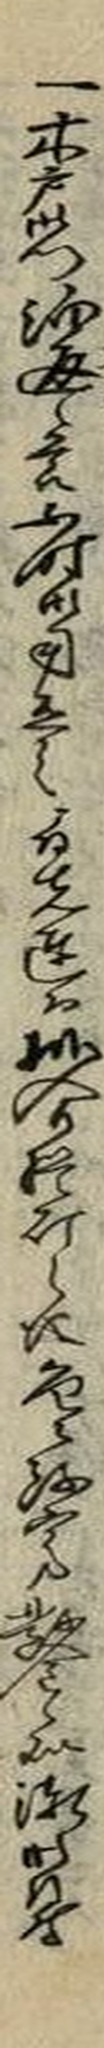一木戸御門泊返候節不時御用有之候に付先達而掛合提灯之儀色々致穿鑿候処漸御目付
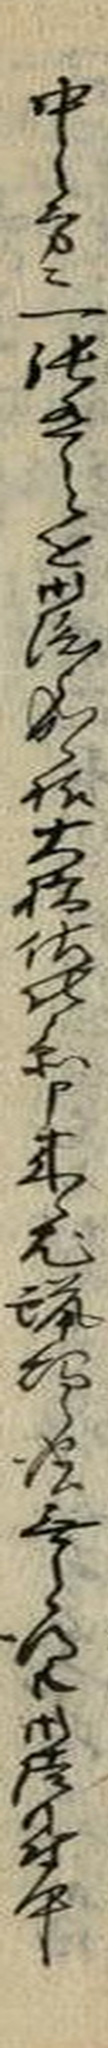中之方に一張有之候を御渡被成候様大橋佐次兵衛申来候尤蝋燭之儀は無之候得共御徒目付中
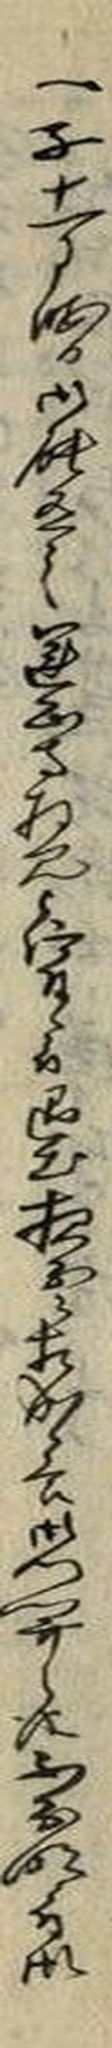一子十一月晦日御能有之運正寺拝見被仰付候ニ付退出夜分に相成候節御門開之儀不分明に付御
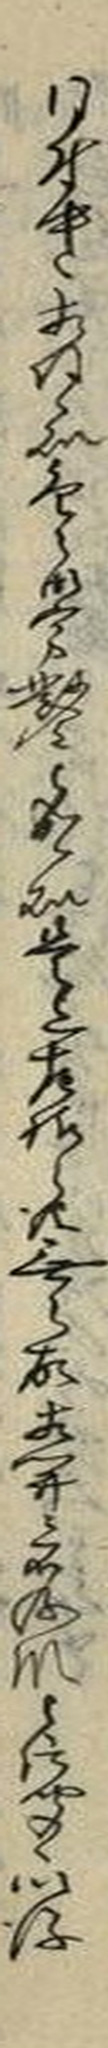目付中へ相伺候処色々御穿鑿被成候処是迄左様之儀無之候故相開に不及段被仰聞候以後
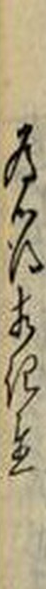為心得相記置
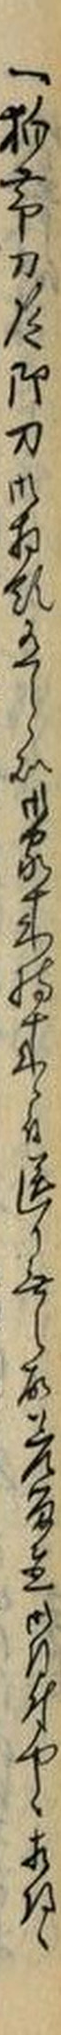一狛帯刀殿御刀御拝領有之候処御家来持来候に付送り無之候故差留置御目付中へ相伺候
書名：御門御櫓之部
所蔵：福井県文書館 Fukui Prefectural Archives
